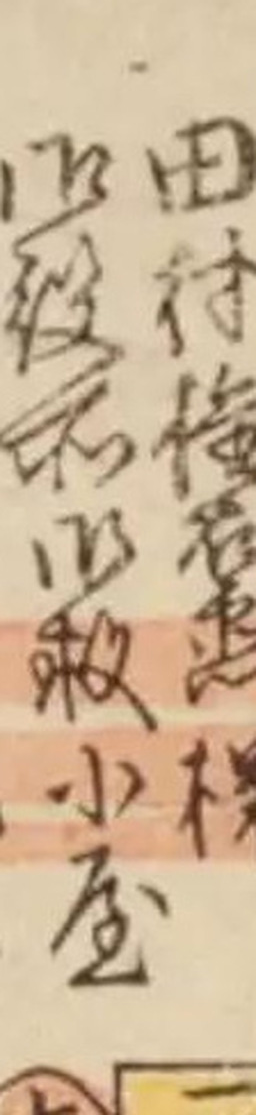御役所御救小屋
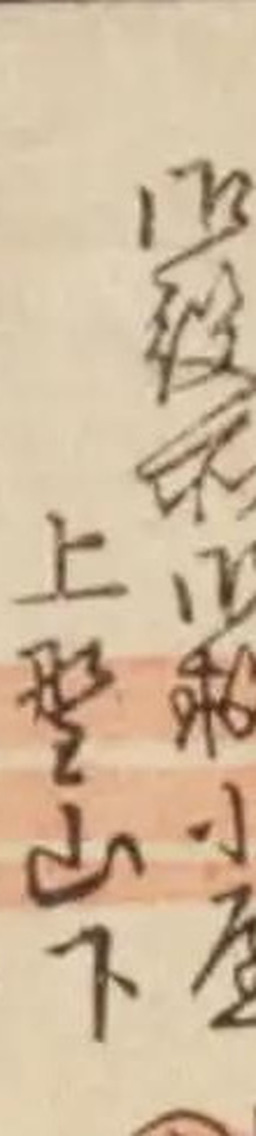上野山下
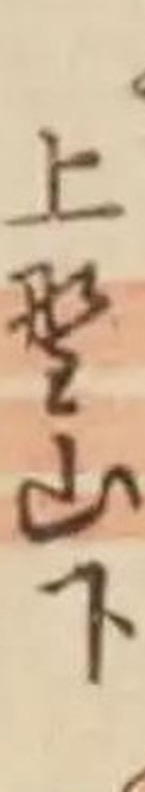上野山下
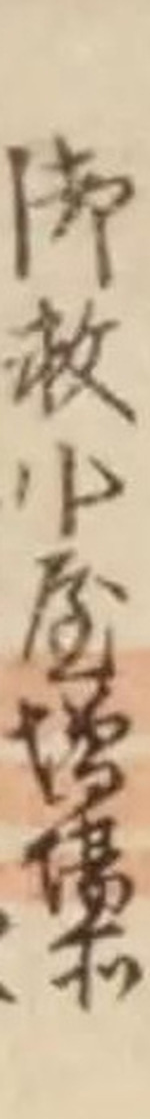御救小屋増場所
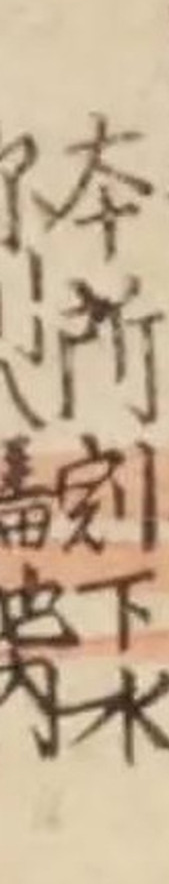本所割下水
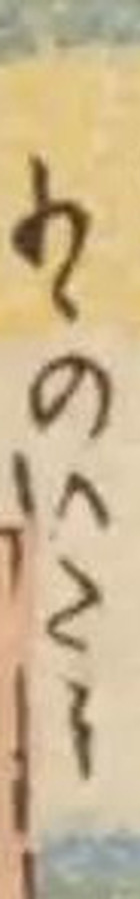少々のいたみ
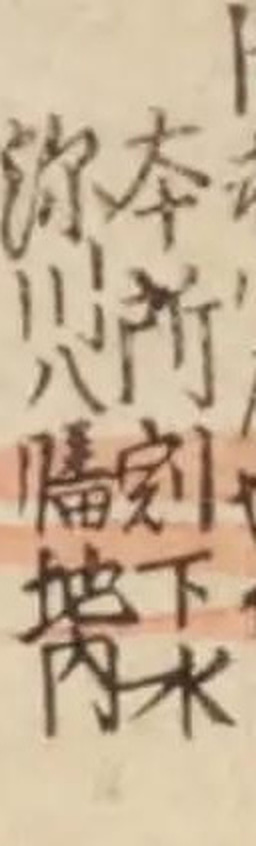深川八幡地内
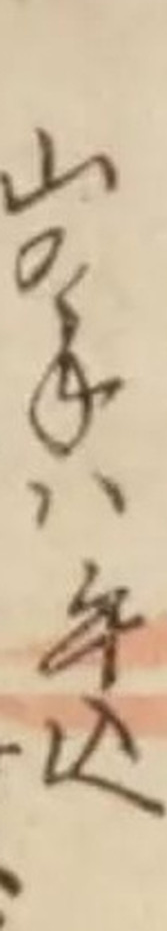山の手は牛込
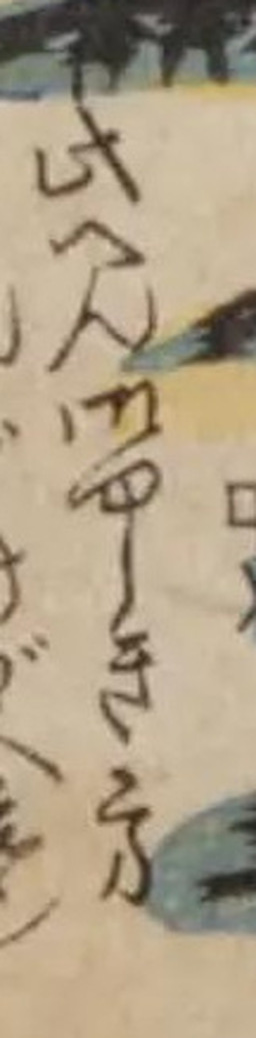此へん御やしき方
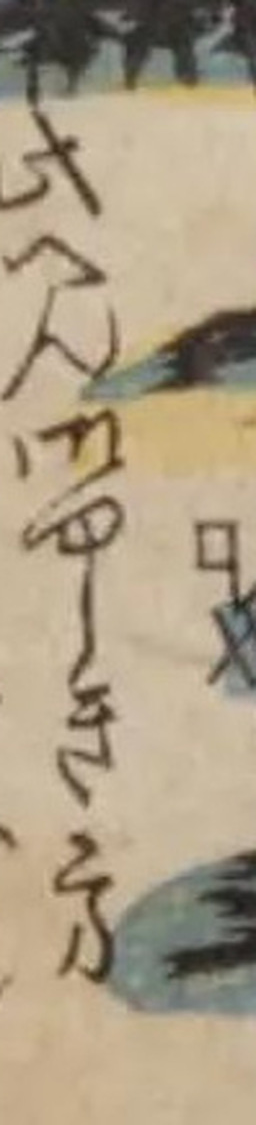此へん御やしき方
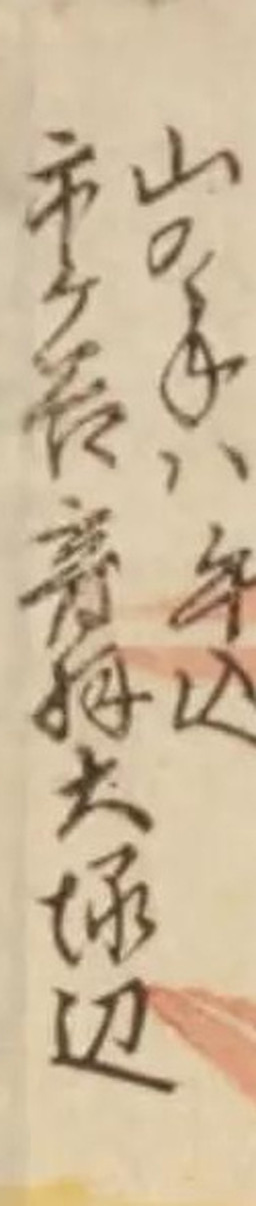市ヶ谷宝羽大塚辺
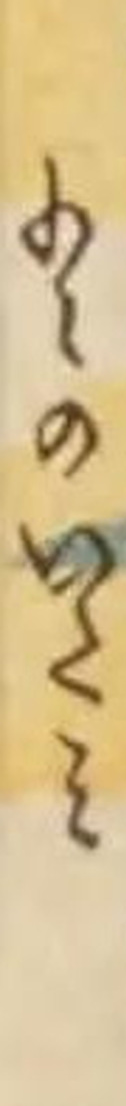少々のいたみ
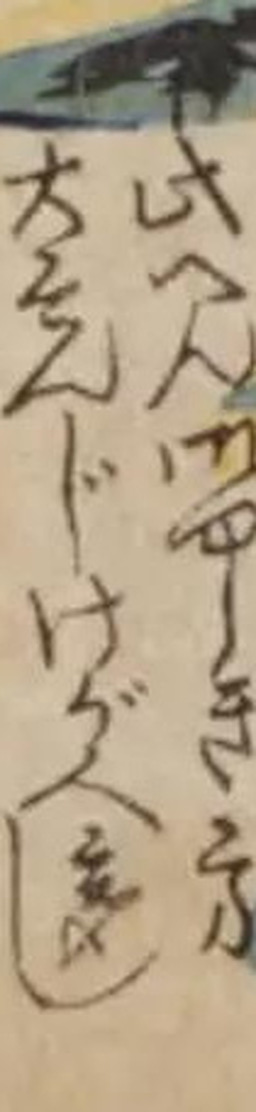大そんじけが人多し

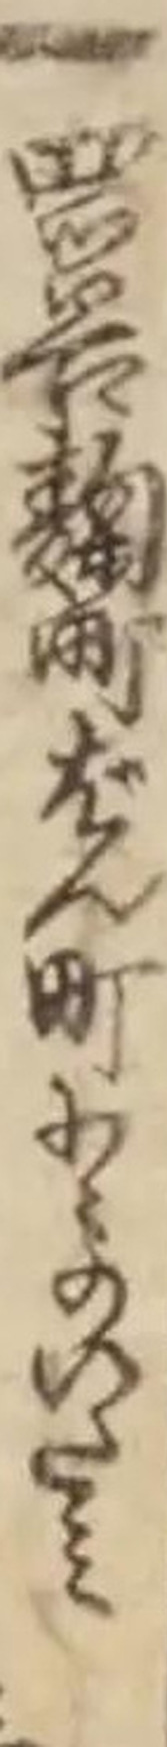四ツ谷麹町ばん町少々のいたみ
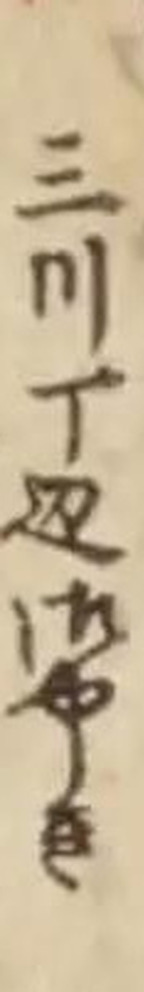三川丁へん御やしき
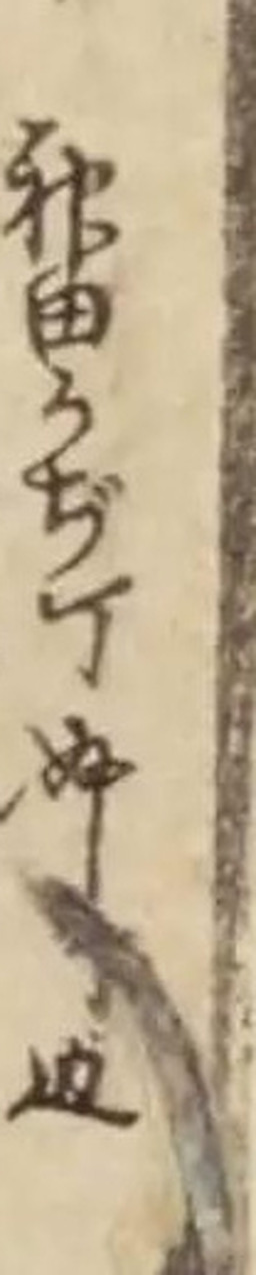神田かぢ丁ぬし丁辺
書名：銘細改板江戸大地震出火場所附
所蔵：国立国会図書館 National Diet Library, JAPAN
